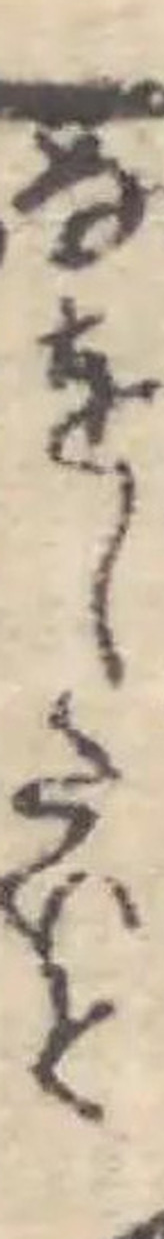なをしたいと
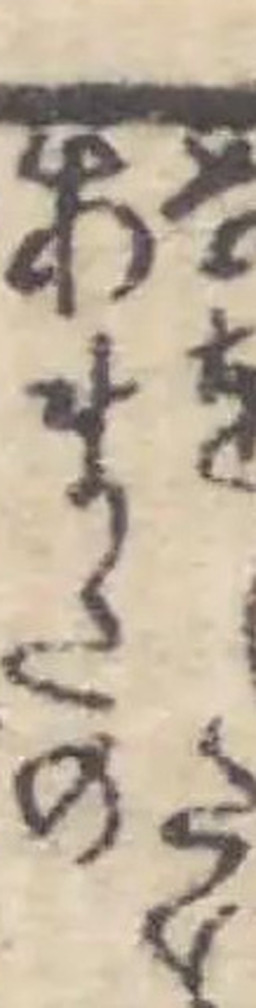あまたの
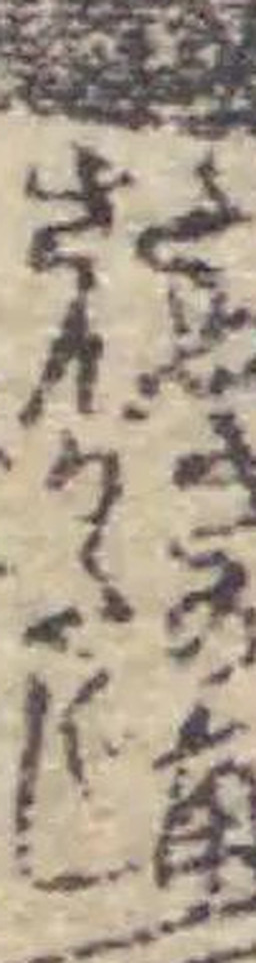さんがたくしは
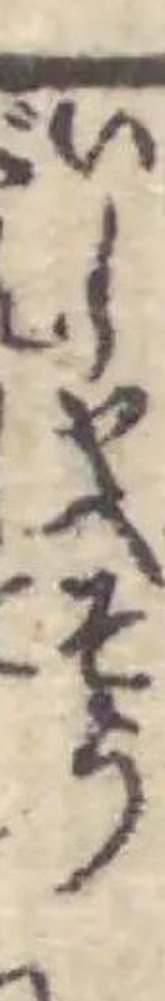いしやへそう
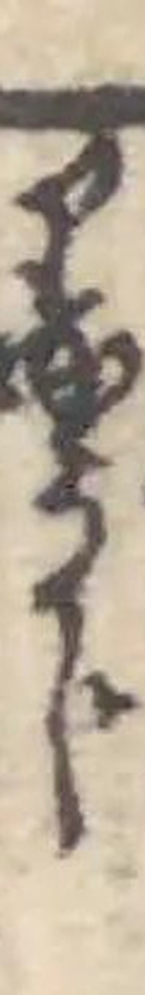りやうじ
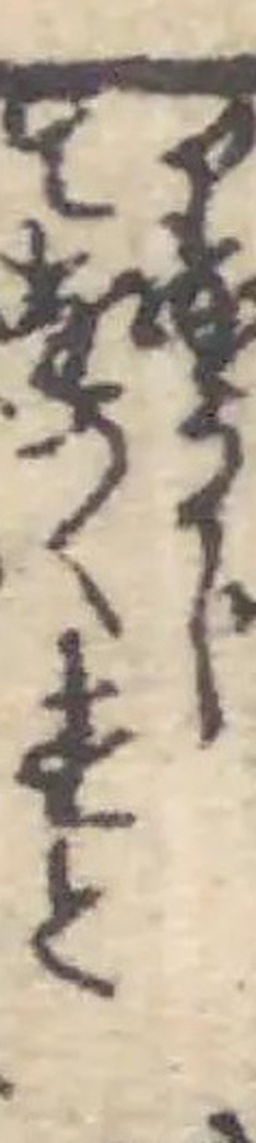てをつくすと
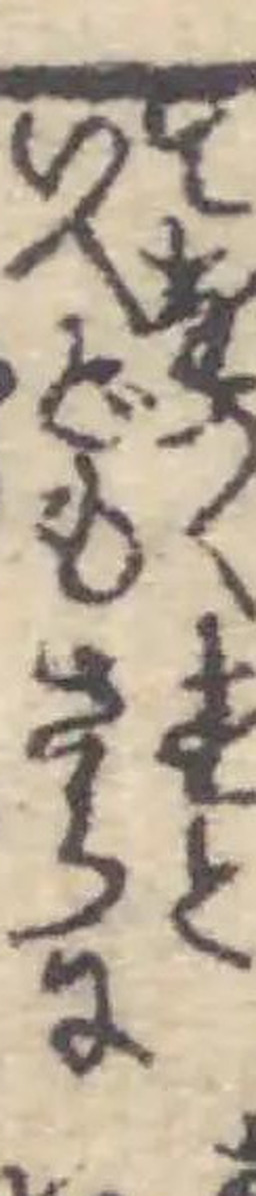いへどもさらに
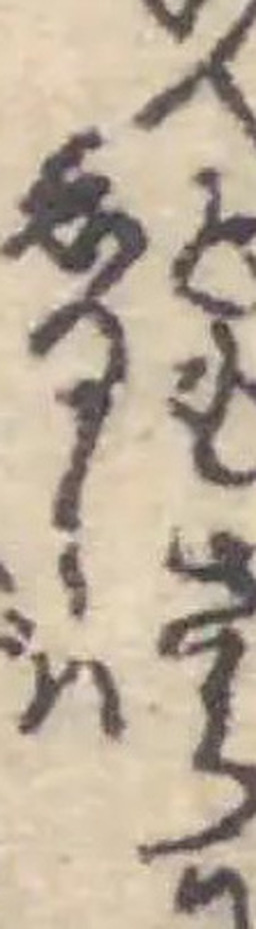しるしは
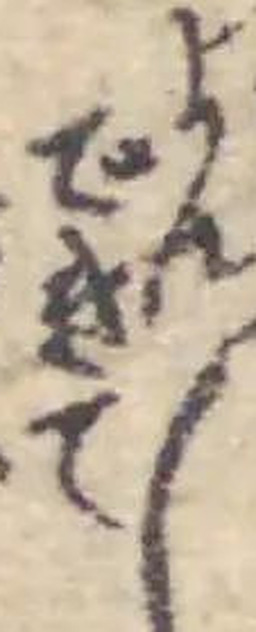できて
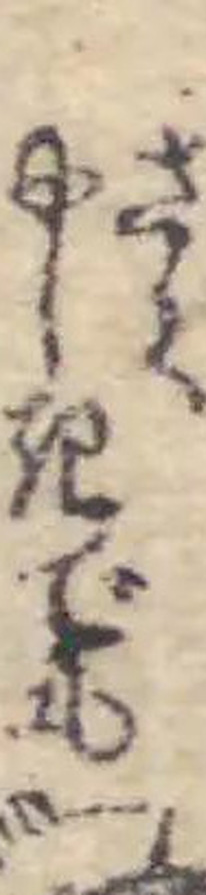やしきでも
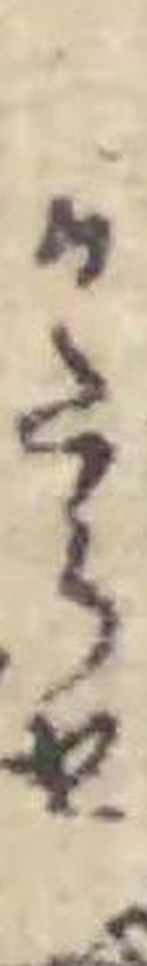かたらせ

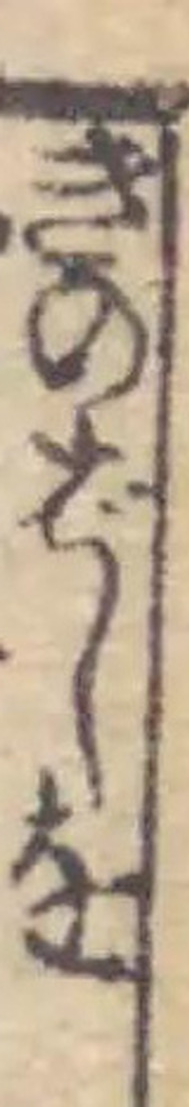きのばしを
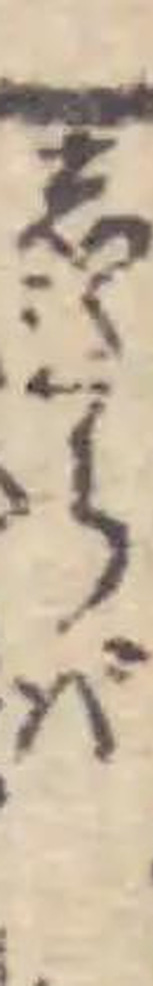したらば
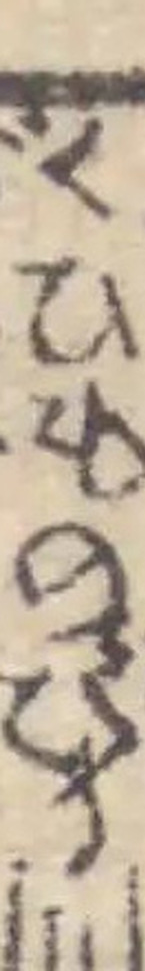くびものびる
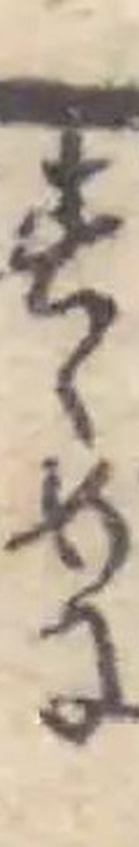すゝめに
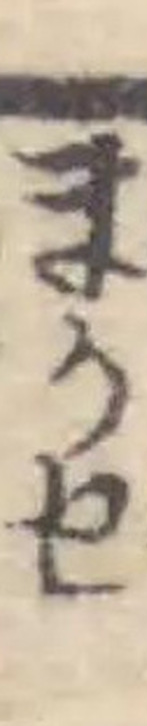まかせ
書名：化物尽 4巻
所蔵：国立国会図書館 National Diet Library, JAPAN
